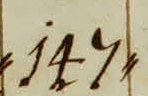147
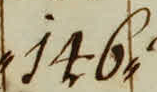146
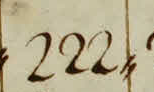222
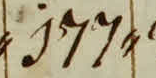177
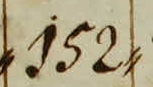152
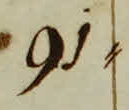91
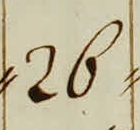26
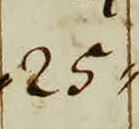25
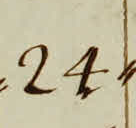24
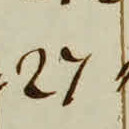27
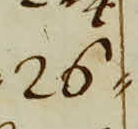26
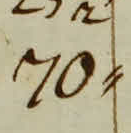70
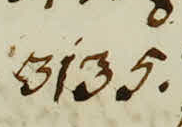3135
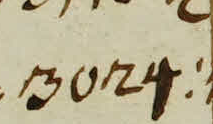3024
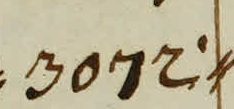3072
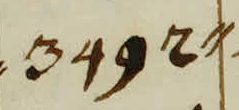3492
